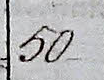50
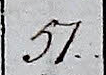57.
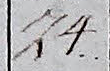24.
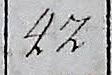42
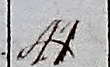41
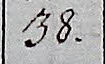38.
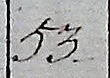53.
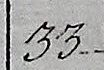33
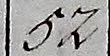52
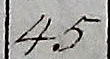45
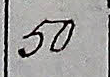50
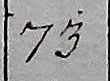73
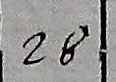28
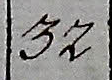32
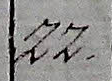22
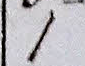1
